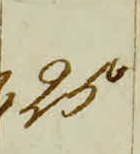25
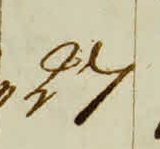27
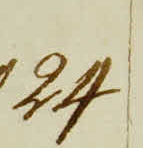24
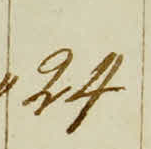24
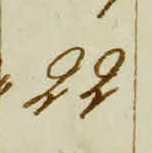22
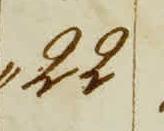22
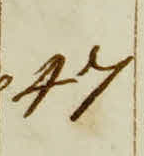47
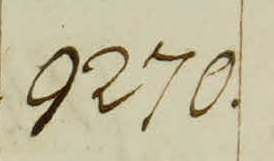9270.
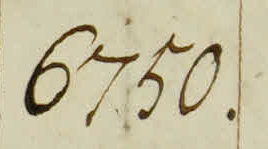6750.
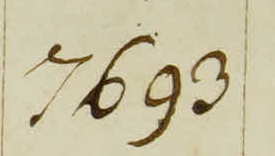7693
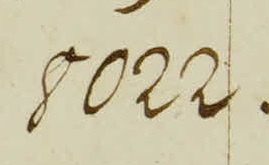8022
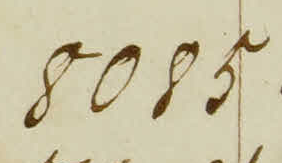8085
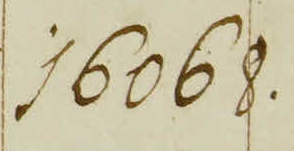16068
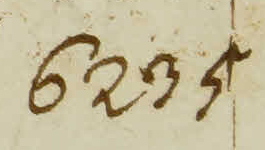6235
